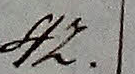42.
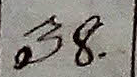38.
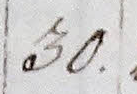30.
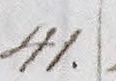41.
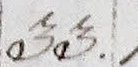33.
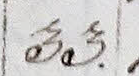33.
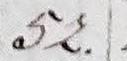52.
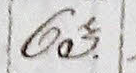63.
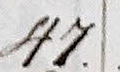47.
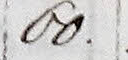60.
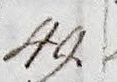49
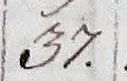37.
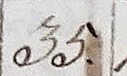35.
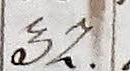32.
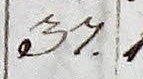37.
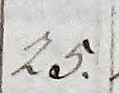25.
